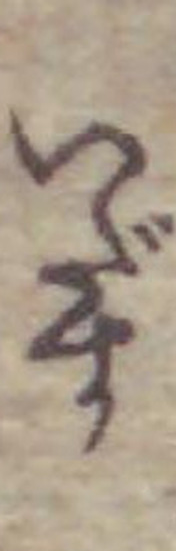いだす

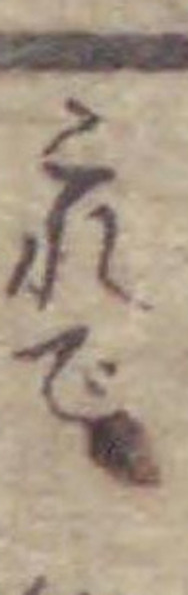これで
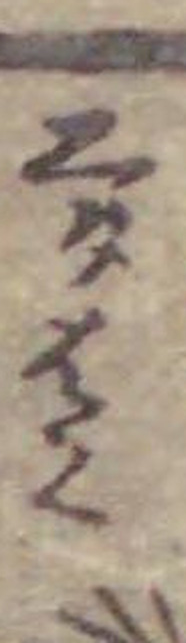二タはこ
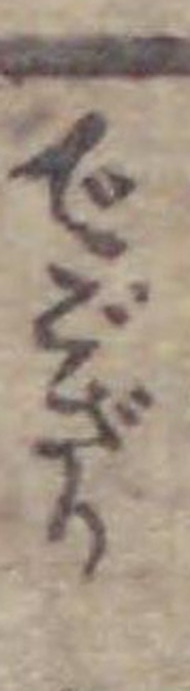でござり
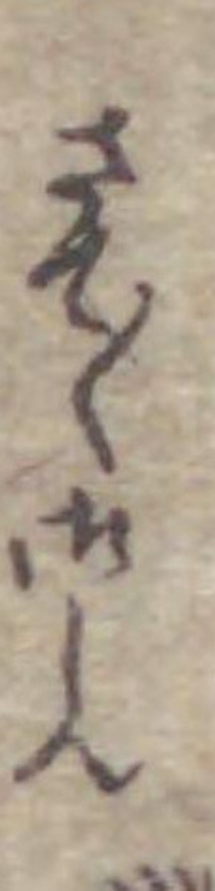さて〳〵御しん
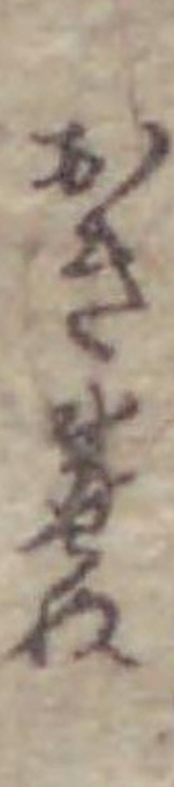おきませぬ
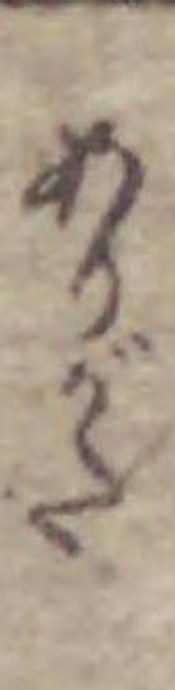ありがた
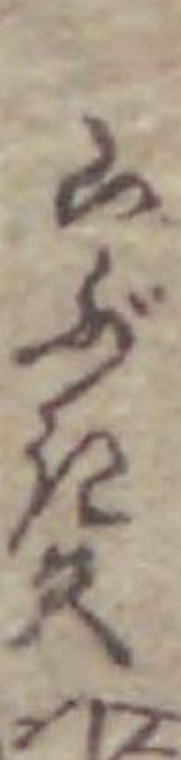山ぶき色
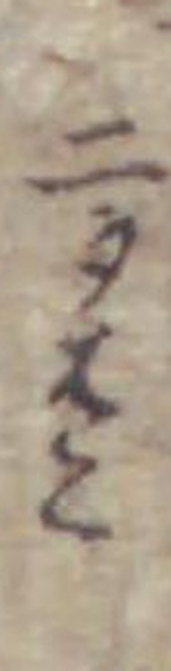二タはこ
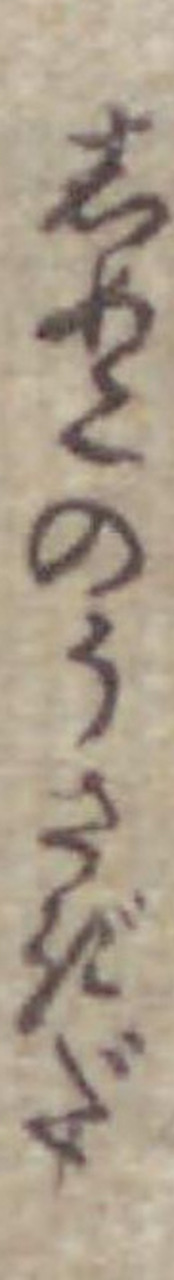しめこのうさぎだ
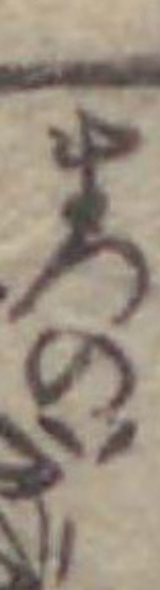まつの
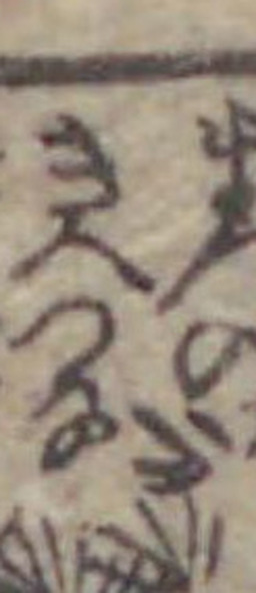きへつな
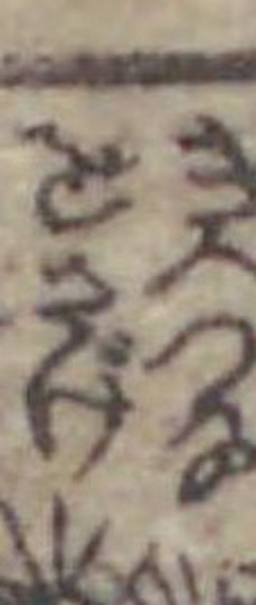をさげ
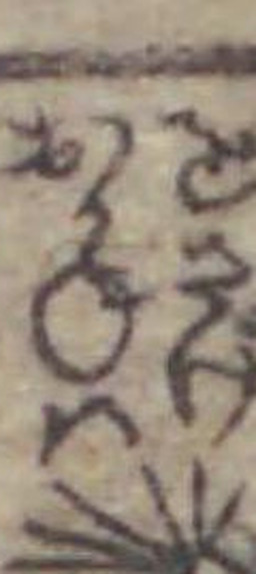おかねは
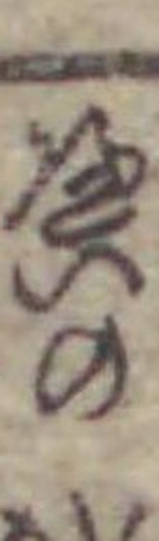へいの
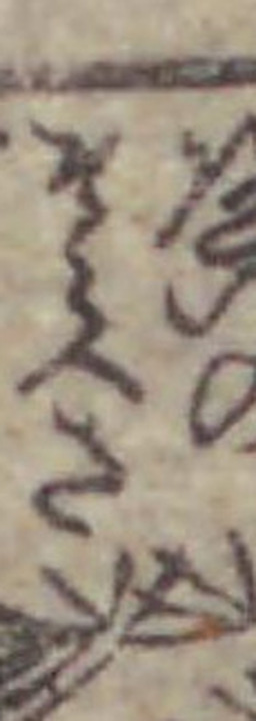そとへさ
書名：嗚呼不侭世之助噺 : 3巻
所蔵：国立国会図書館 National Diet Library, JAPAN
